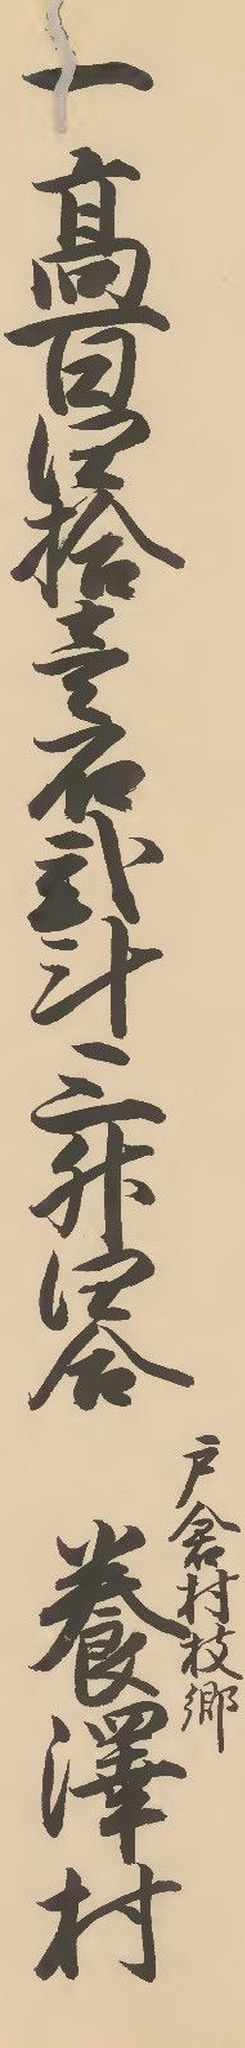一高百四拾壱石弐斗三升四合養澤村
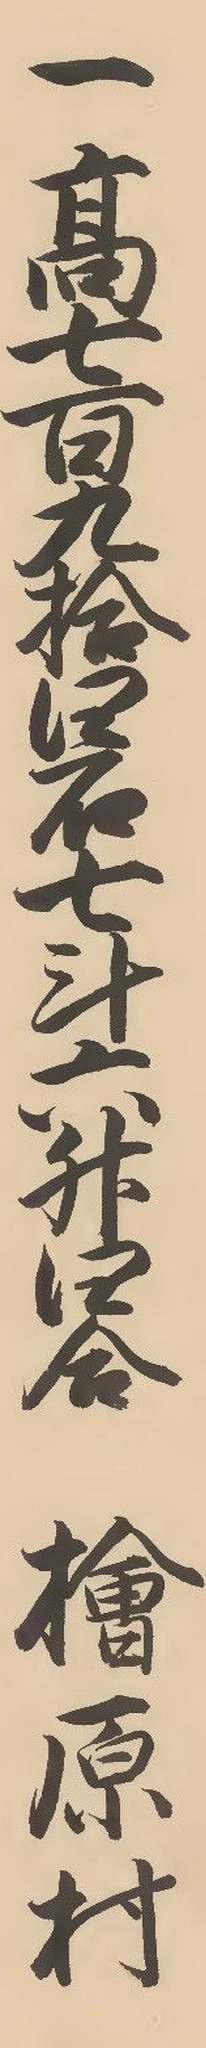一高七百九拾四石七斗六升四合檜原村
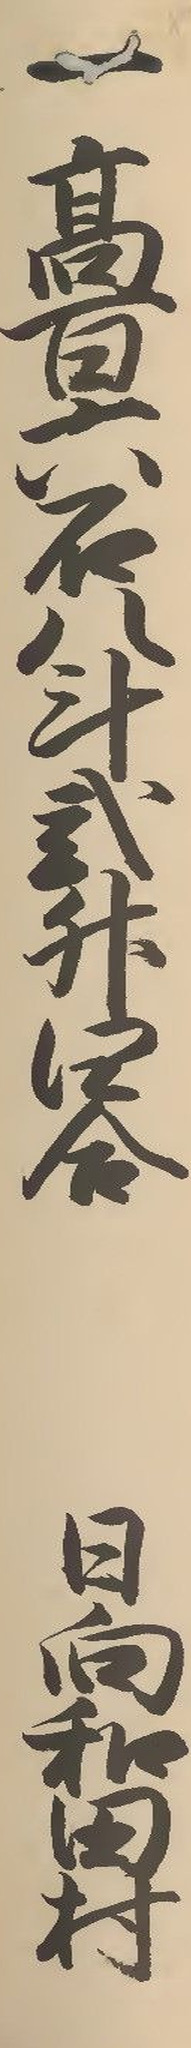一高百六石八斗弐升四合日向和田村
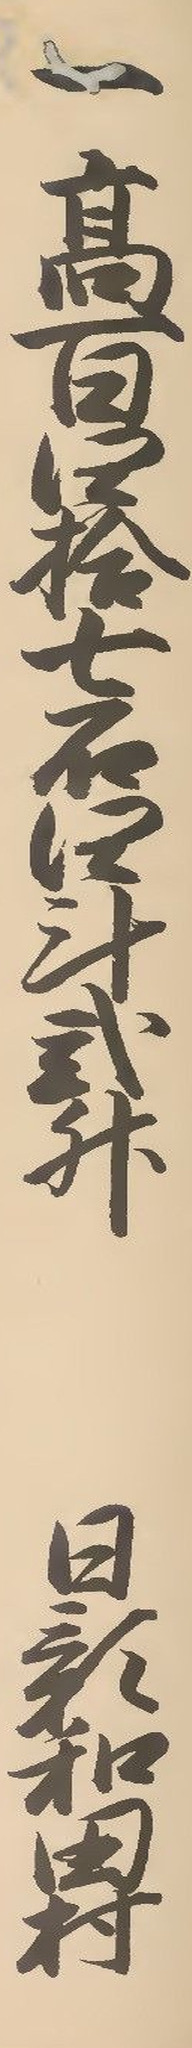一高百四拾七石四斗弐升日影和田村
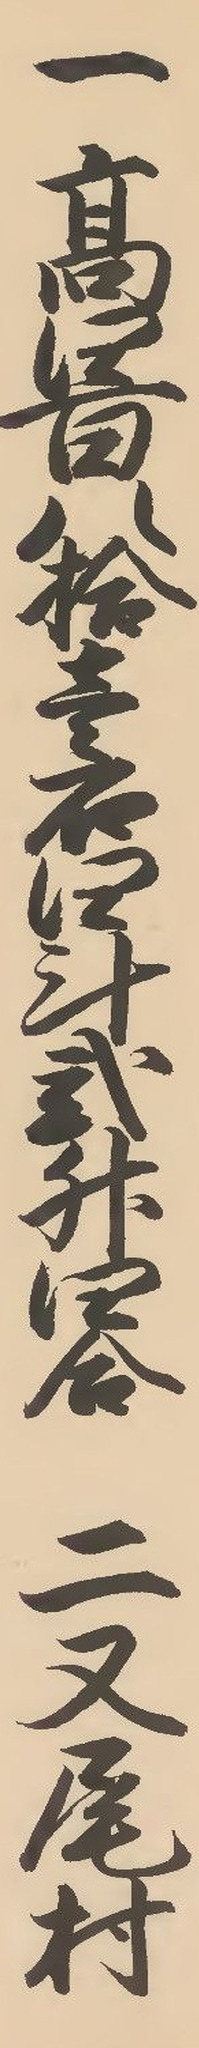一高四百八拾壱石四斗弐升四合二又尾村
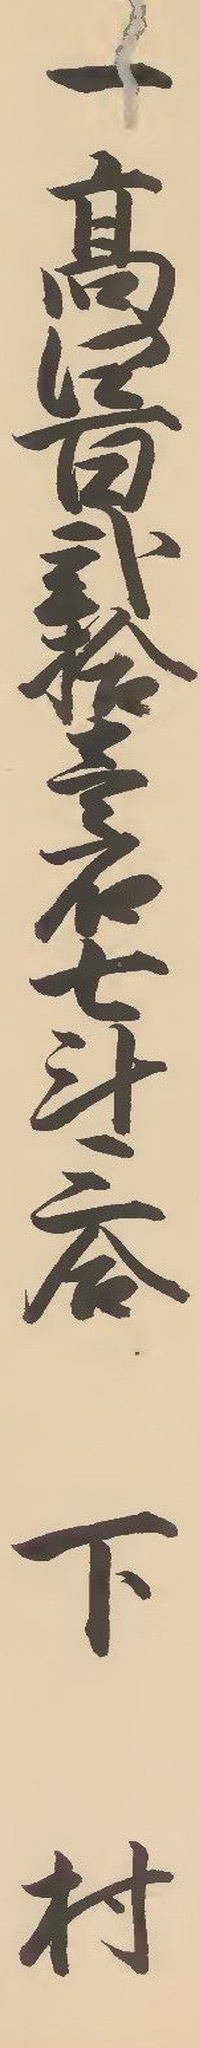一高四百弐拾壱石七斗三合下村
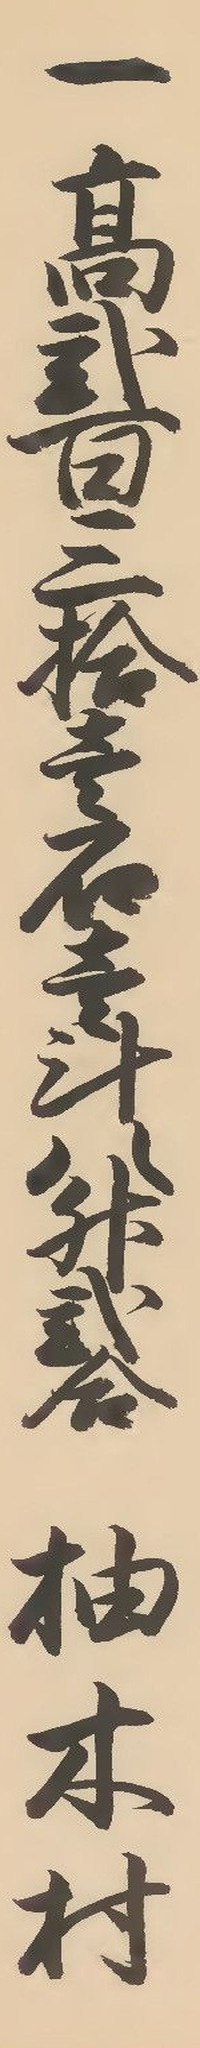一高弐百三拾壱石壱斗八升弐合柚木村

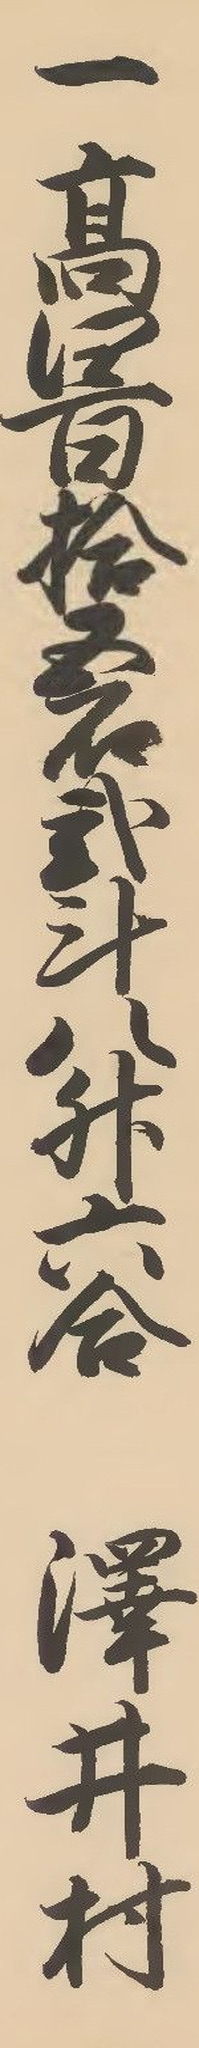一高四百拾五石弐斗八升六合澤井村
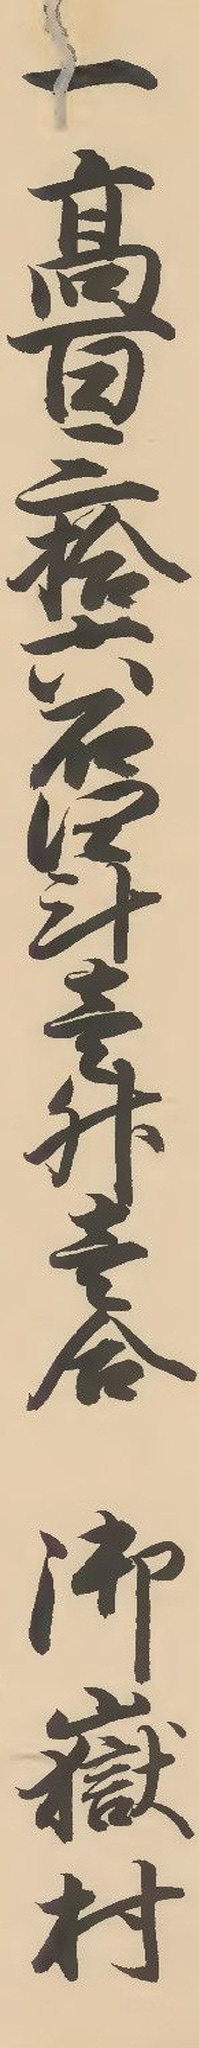一高百三拾六石四斗壱升壱合御嶽村
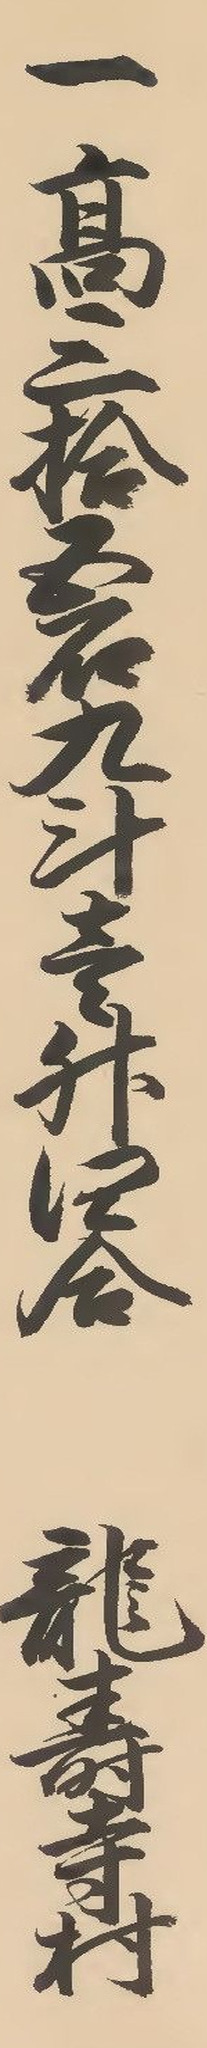一高三拾五石九斗壱升四合龍寿寺村
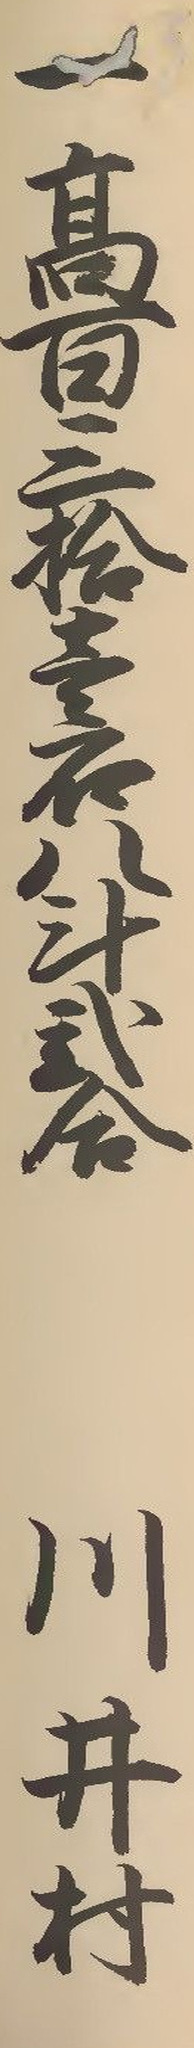一高百三拾壱石八斗弐合川井村
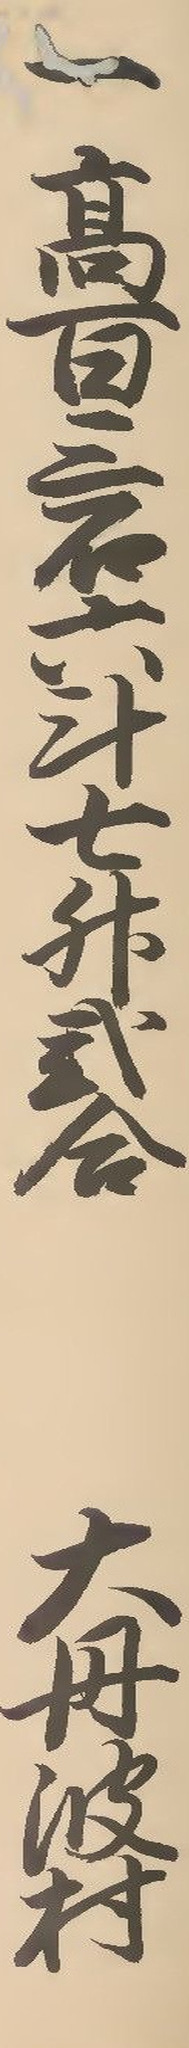一高百三石六斗七升弐合大丹波村
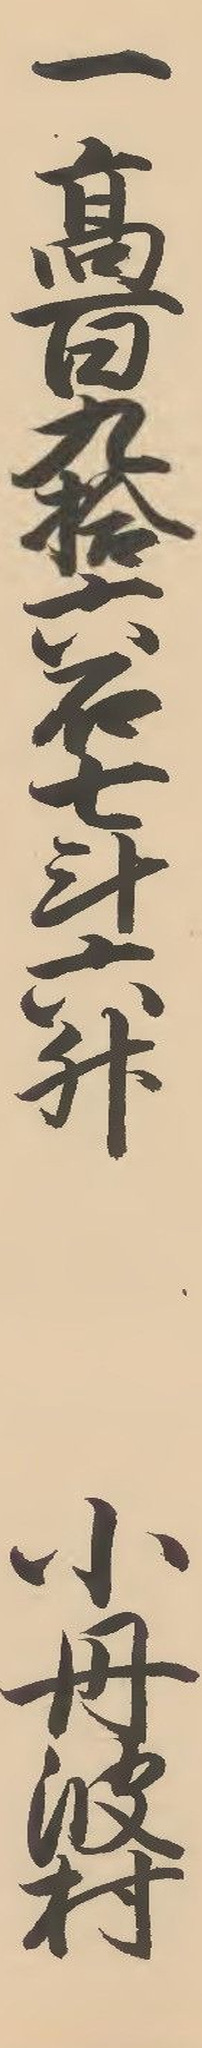一高百九拾六石七斗六升小丹波村
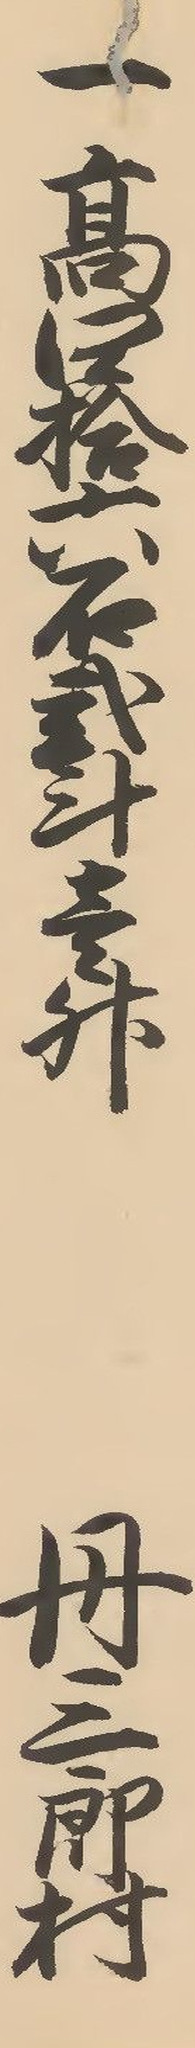一高四拾六石弐斗壱升丹三郎村
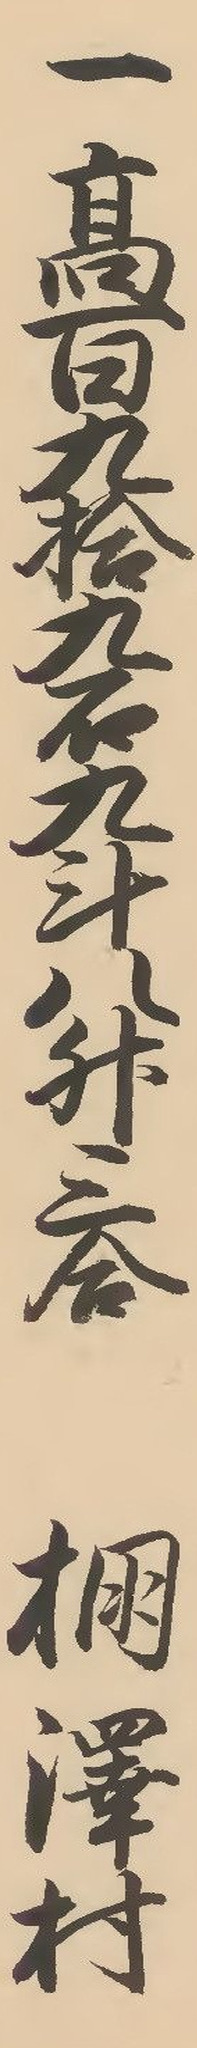一高百九拾九石九斗八升三合棚澤村

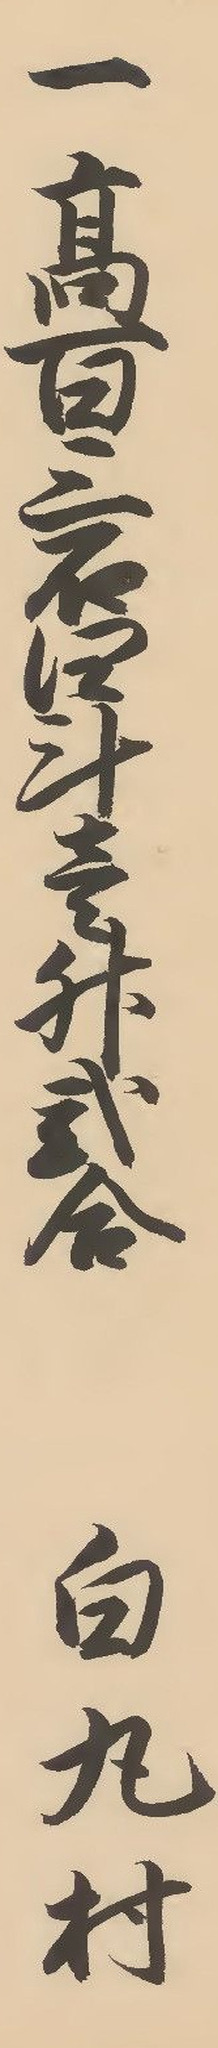一高百三石四斗壱升弐合白丸村
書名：武蔵国郷帳　上
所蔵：国立公文書館 National Archives of Japan
